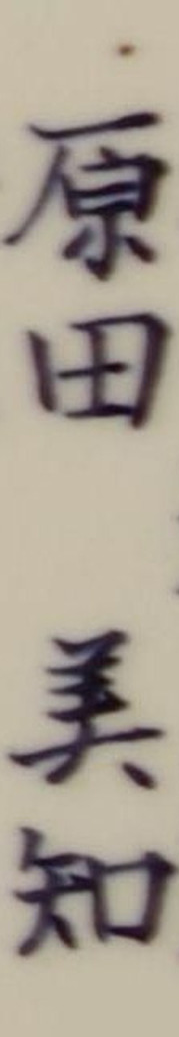原田美知
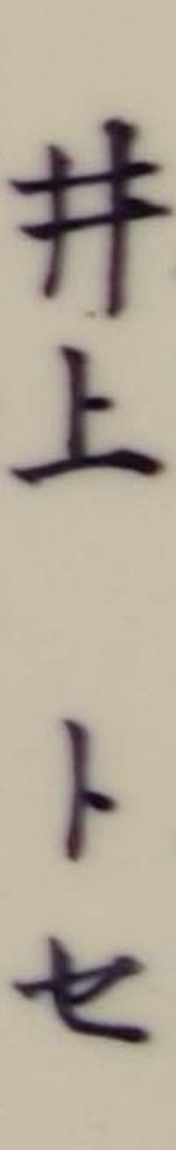井上トセ
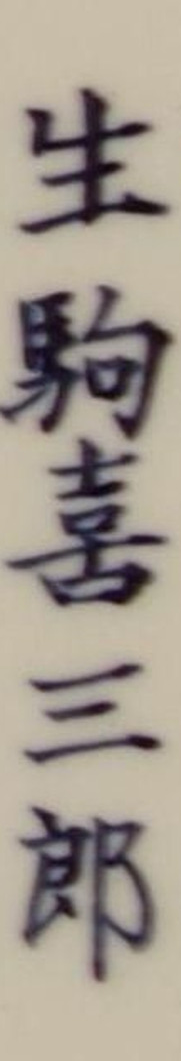生駒喜三郎
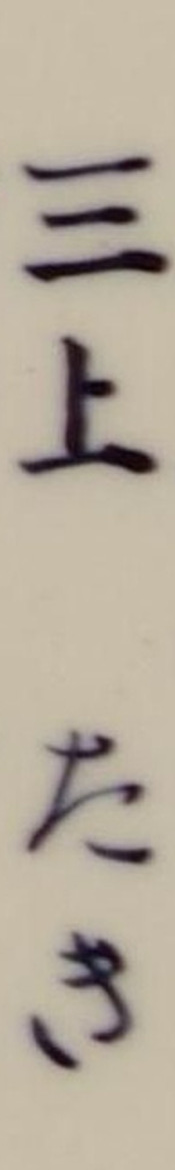三上たき
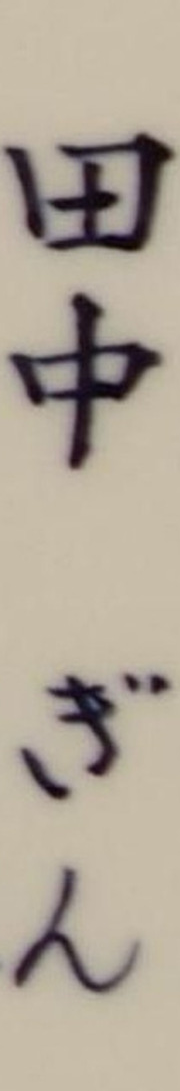田中ぎん
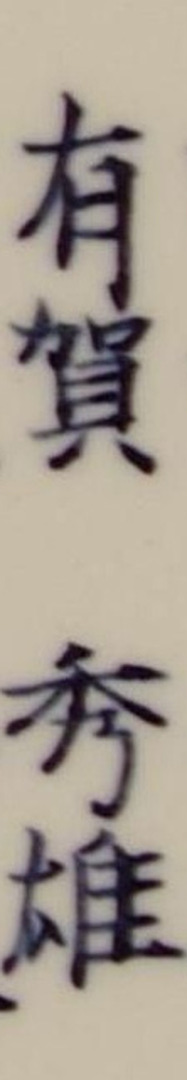有賀秀雄
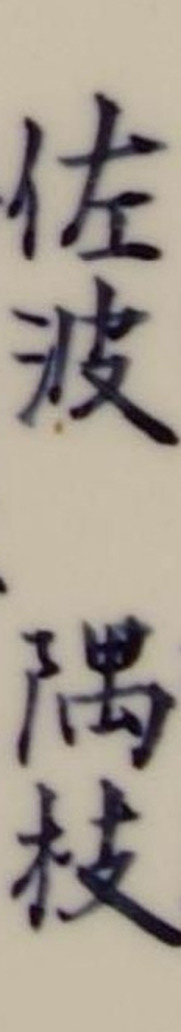佐波隅枝
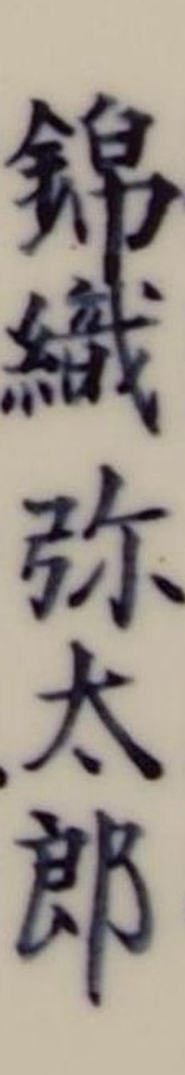錦織弥太郎
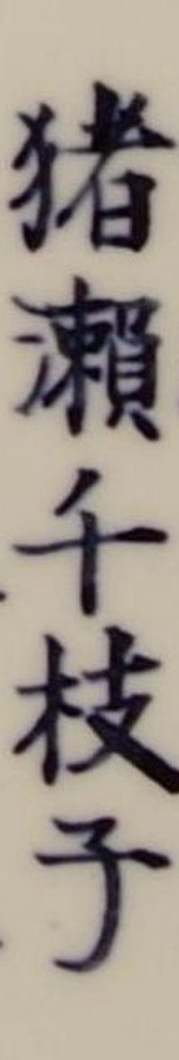猪瀬千枝子
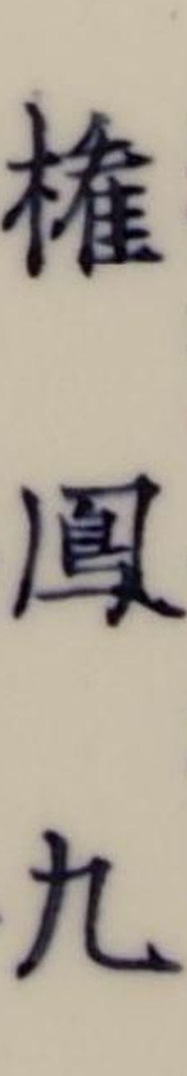権鳳九
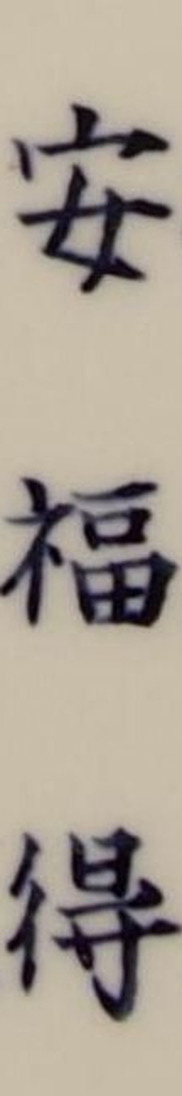安福得
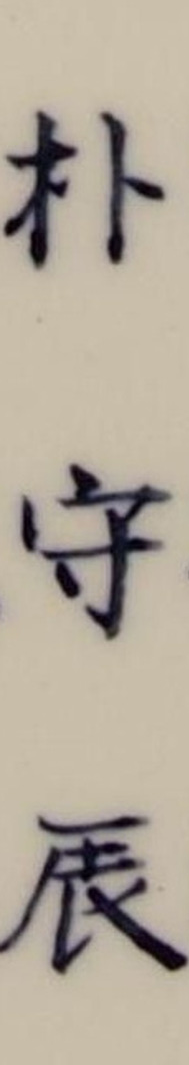朴守辰
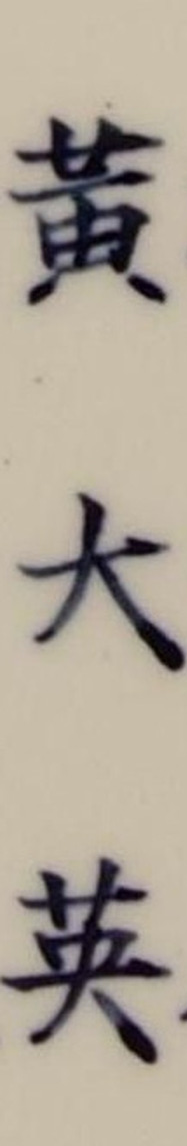黄大英
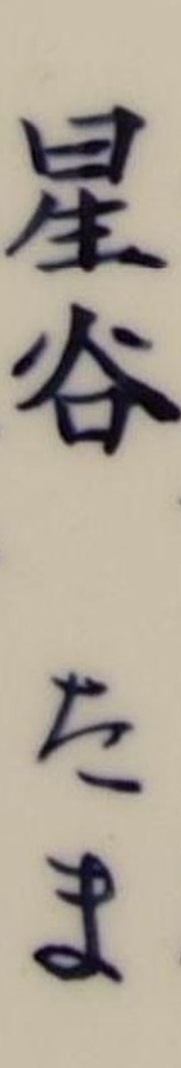星谷たま
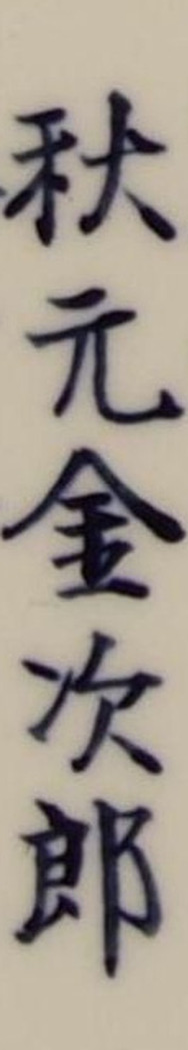秋元金次郎
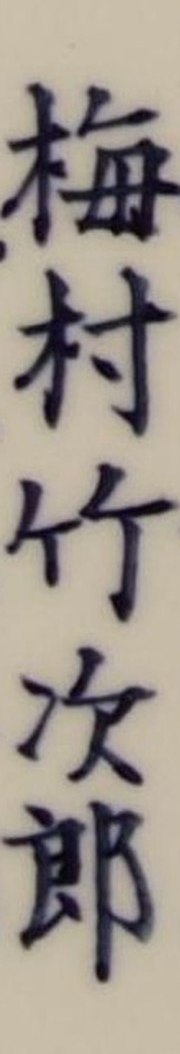梅村竹次郎
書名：E~L
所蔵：高野山金剛峯寺
